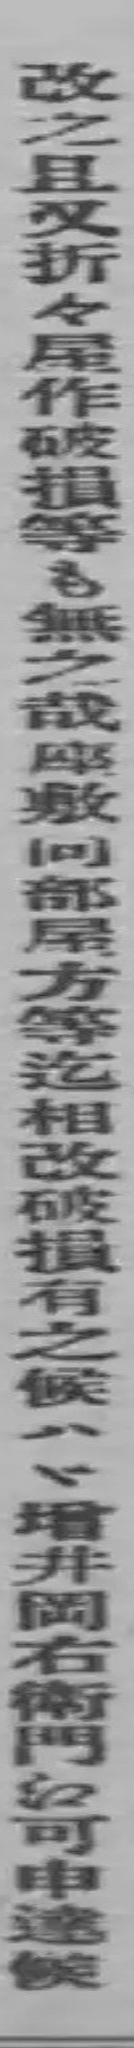改之且又折々屋作破損等も無之哉座敷向部屋方等迄相改破損有之候はゞ増井岡右衛門え可申達候
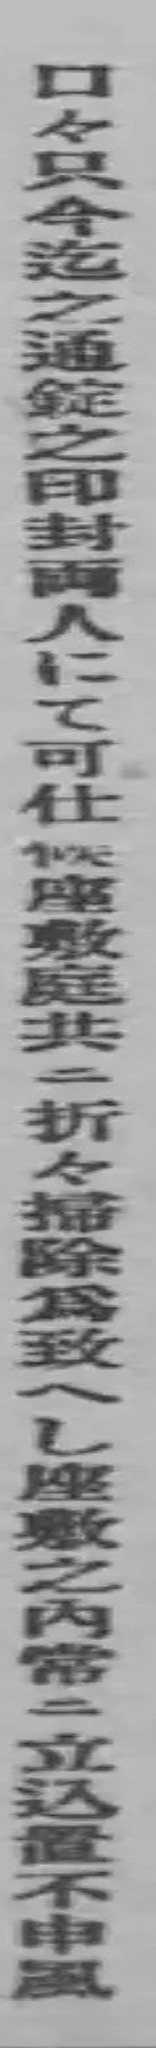口々只今迄之通錠之印封両人にて可仕候座敷庭共ニ折々掃除為致へし座敷之内常ニ立込置不申風
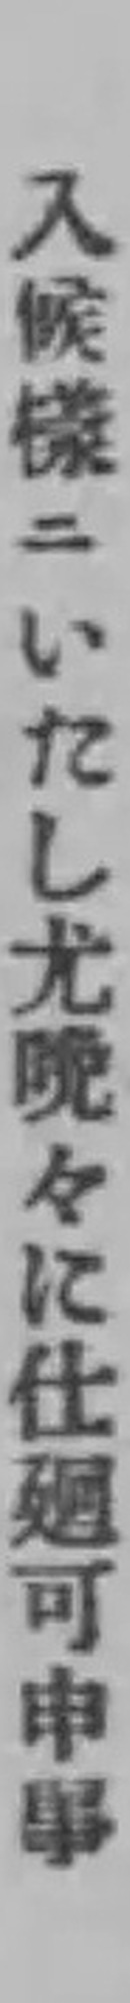入候様ニいたし尤晩々に仕廻可申事
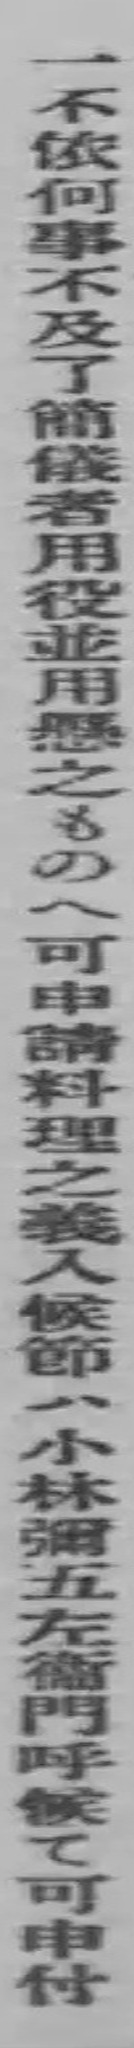一不依何事不及了簡儀者用役並用懸之ものへ可申請料理之義入候節は小林弥五左衛門呼候て可申付
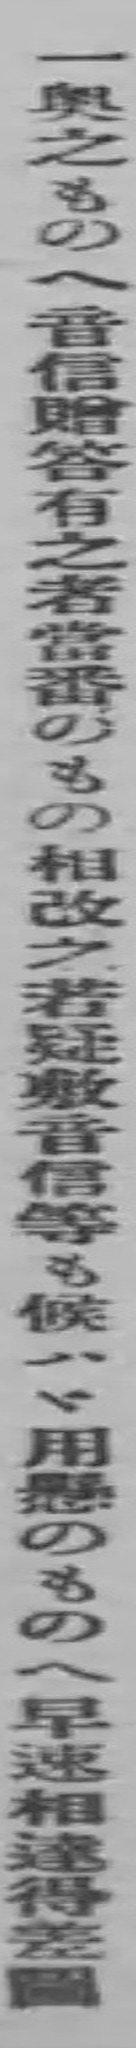一奥之ものへ音信贈答有之者当番のもの相改之若疑敷音信等も候はゞ用懸のものへ早速相達得差図
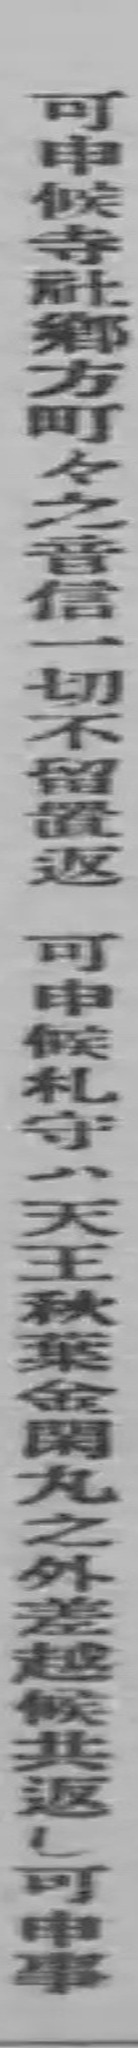可申候寺社郷方町々之音信一切不留置返し可申候札守は天王秋葉金閑丸之外差越候共返し可申事
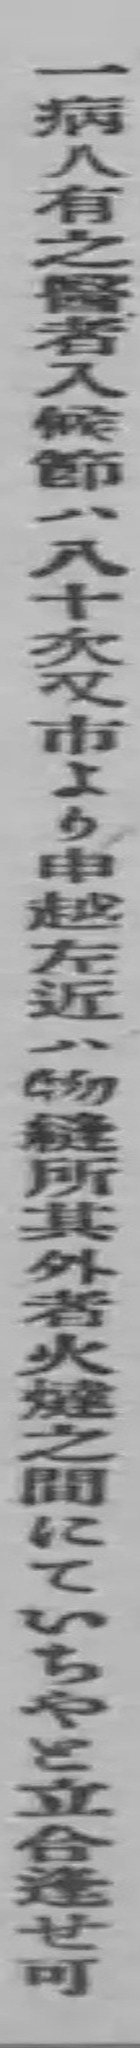一病人有之医者入候節は八十次又市より申越左近は物縫所其外者火燵之間にていちやと立合逢せ可
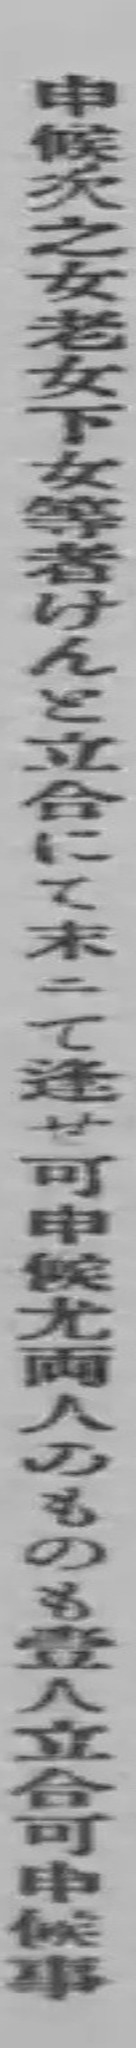申候次之女老女下女等者けんと立合にて末ニて逢せ可申候尤両人のものも壱人立合可申候事
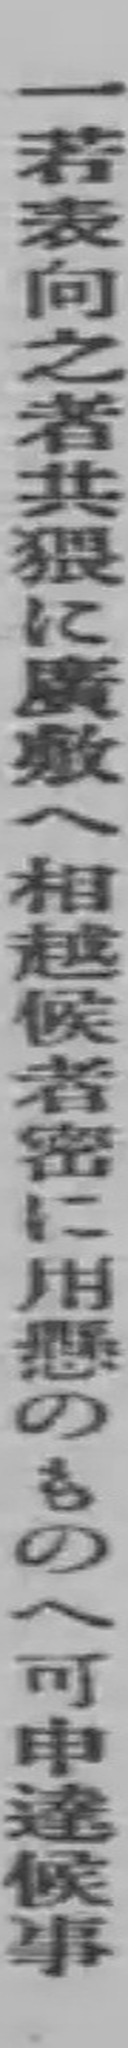一若表向之者共猥に広敷へ相越候者蜜に用懸のものへ可申達候事
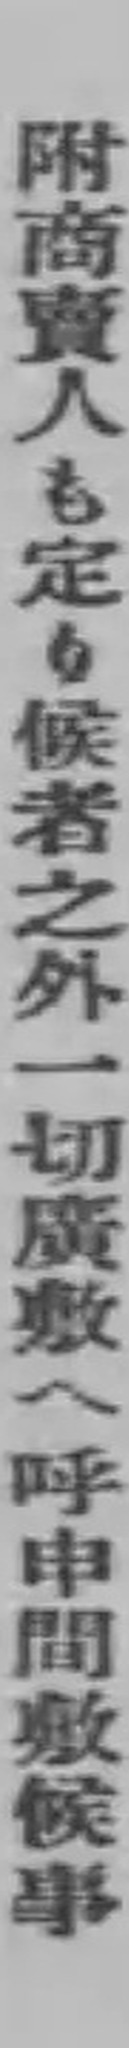附商売人も定り候者之外一切広敷へ呼申間敷候事
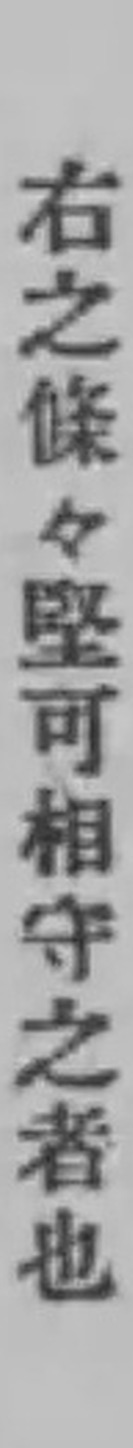右之條々堅可相守之者也
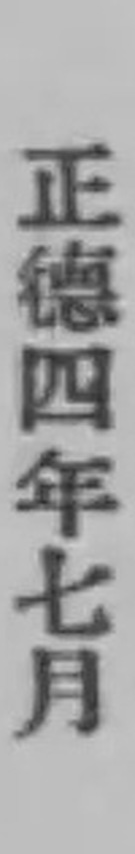正徳四年七月日
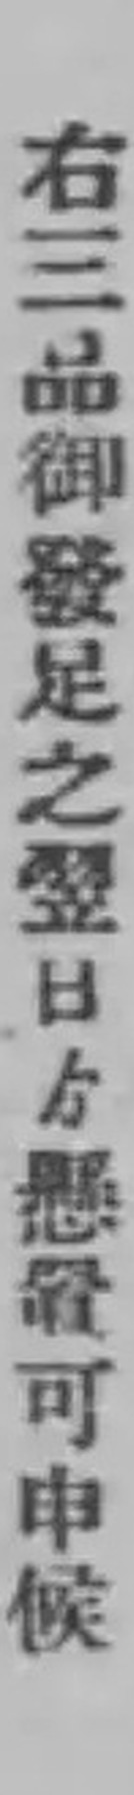右三品御発足之翌日ゟ懸置可申候
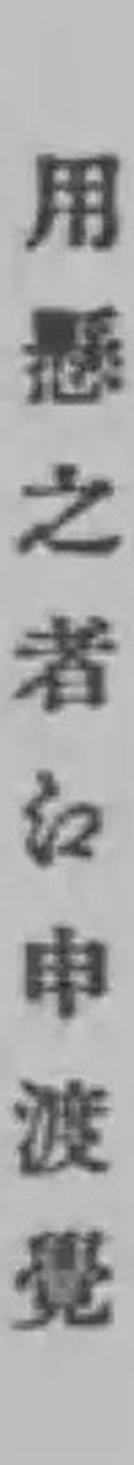用懸之者え申渡覚
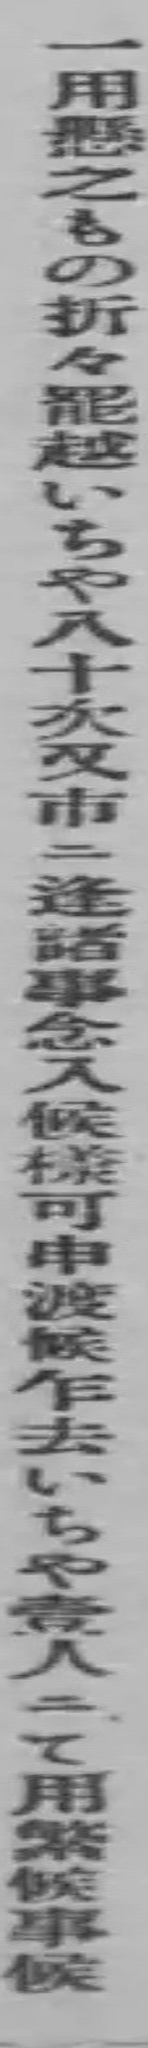一用懸之もの折々罷越いちや八十次又市ニ逢諸事念入候様可申渡候乍去いちや壱人ニて用繁候事候
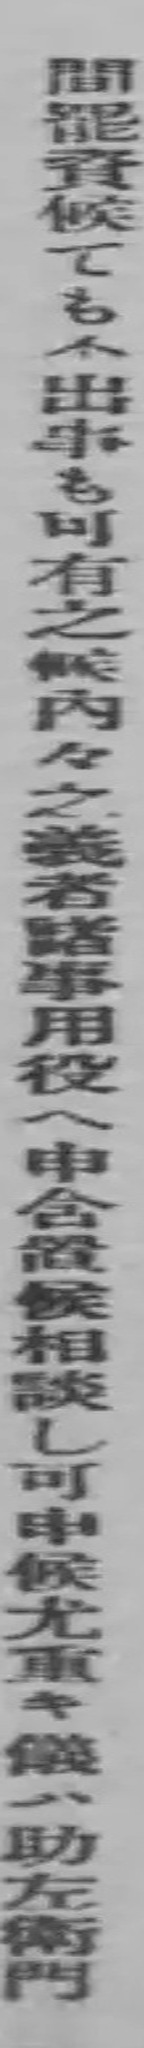間罷資候ても不出事も可有之候内々之義者諸事用役へ申含置候相談し可申候尤重キ儀は助左衛門
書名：豊橋市史談
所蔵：国立国会図書館 National Diet Library, JAPAN
